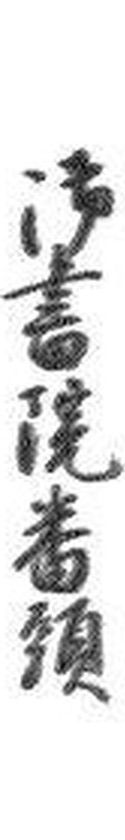御書院番頭
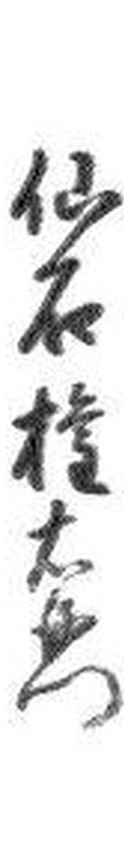仙石権右衛門
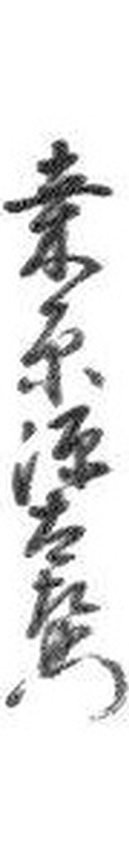桑原源太左衛門

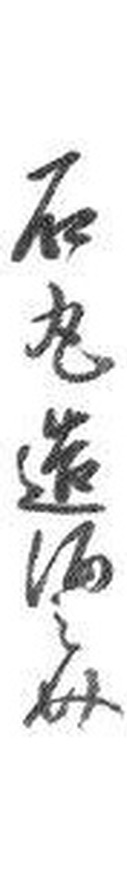石丸造酒之介
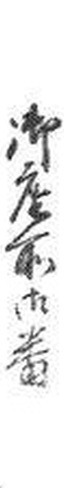御座所御番
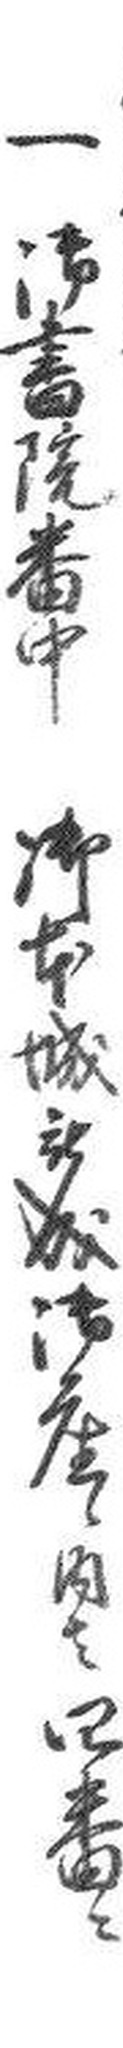一御書院番中御本城被成御座候内者四番ニ
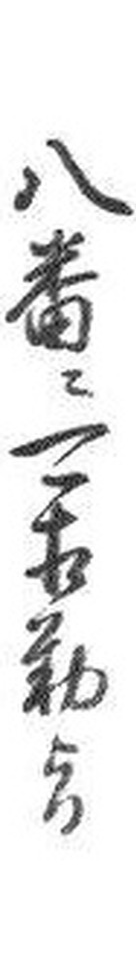四番可相勤旨
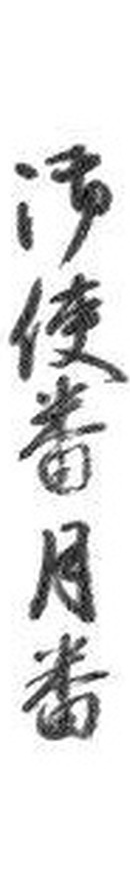御使番月番
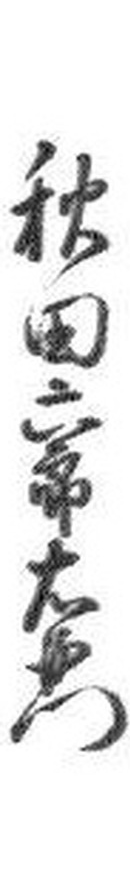秋田六郎右衛門
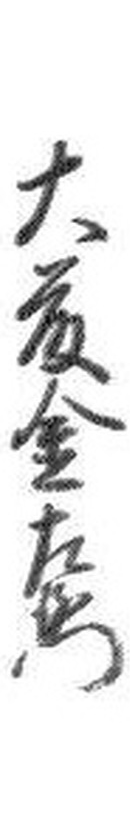大藤金左衛門
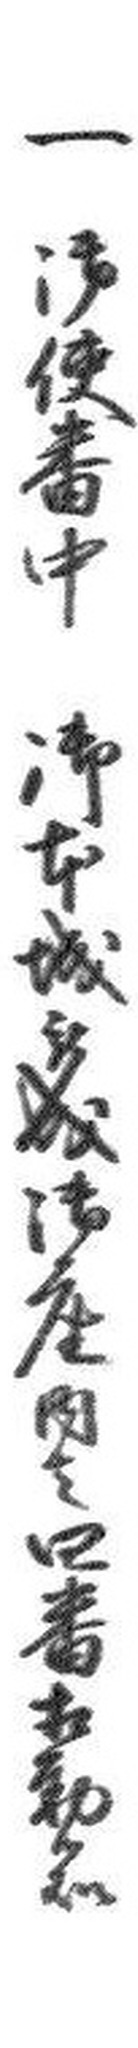一御使番中御本城被成御座内者四番相勤候処
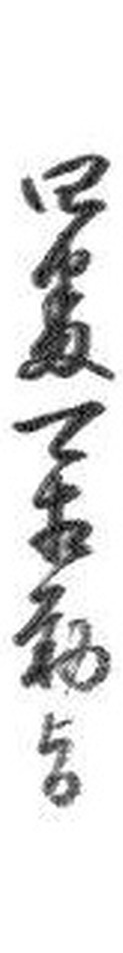四番可相勤旨
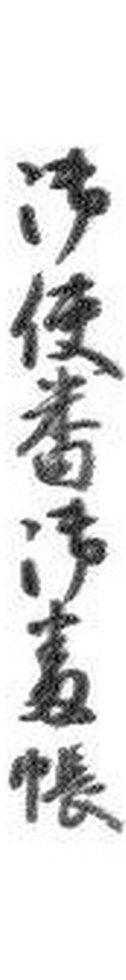御使番御番帳
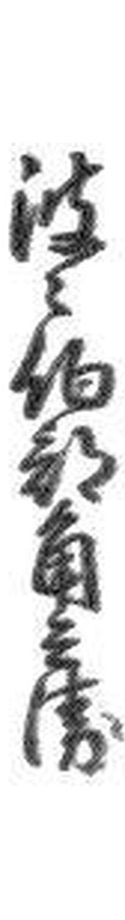一番波々伯部角兵衛
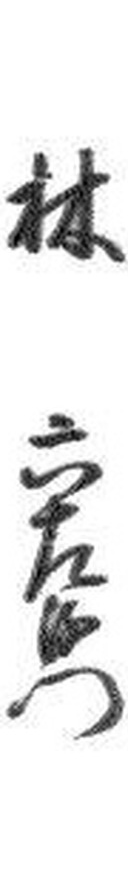林六左衛門

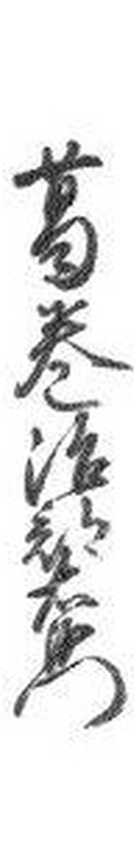葛巻治部右衛門
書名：家譜 十一 昌親公 従延宝二年到延宝四年八月
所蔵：福井県文書館 Fukui Prefectural Archives
